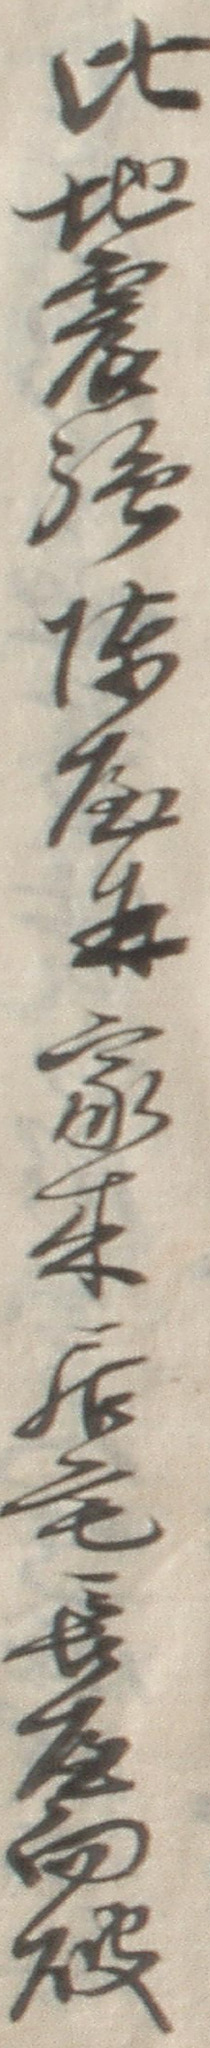比地震強陣屋并家来居宅長屋向破
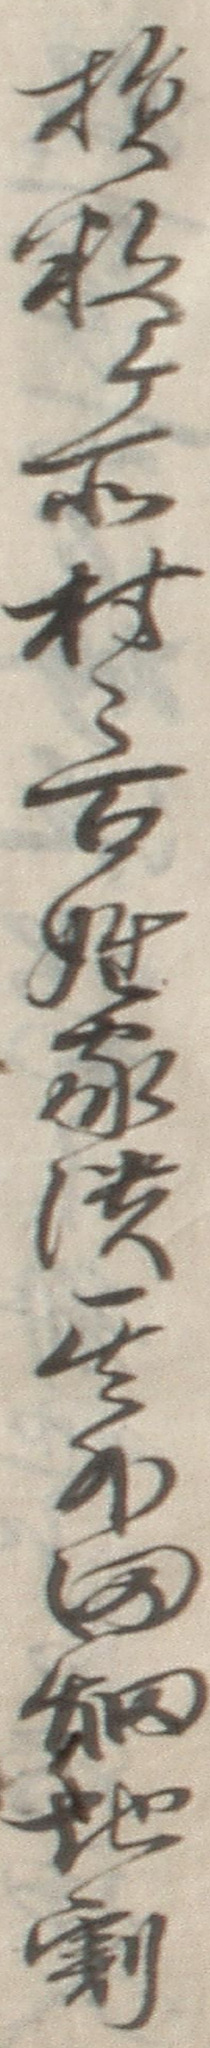損数ヶ所村々百姓家潰其外田畑地割

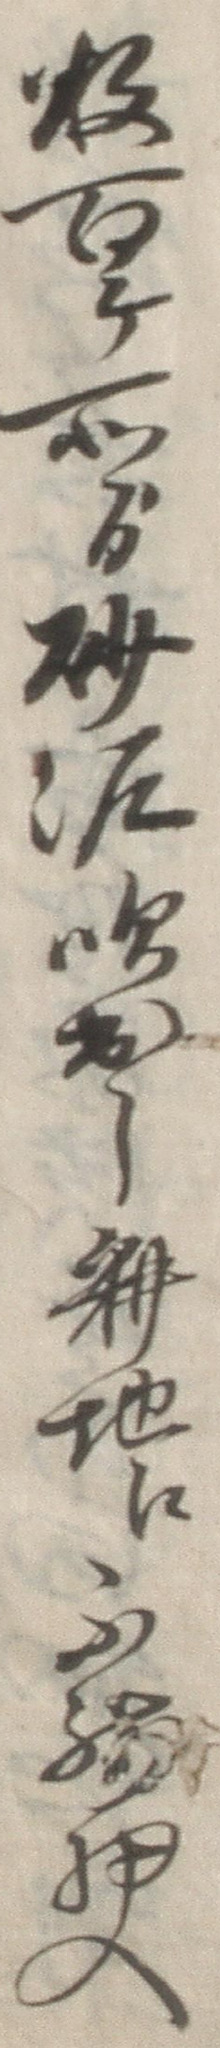数百ヶ所ゟ砂泥吹出し耕地江不残押入
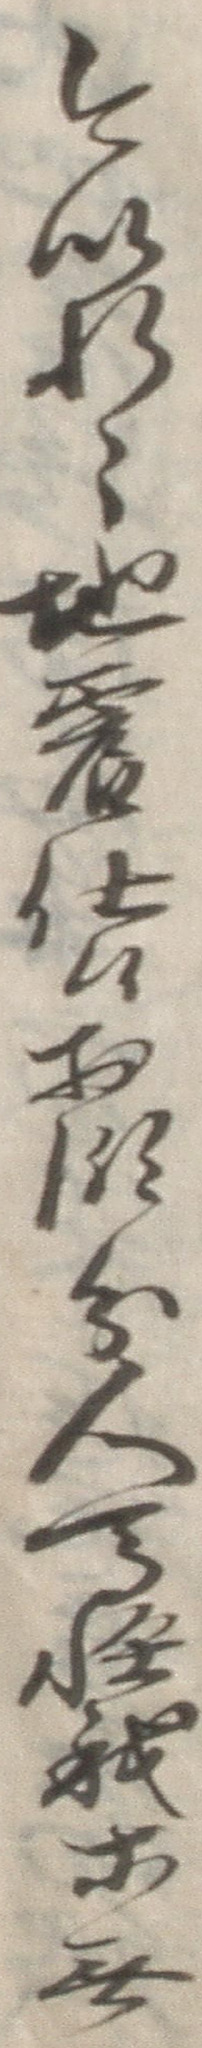今以折々地震仕候於領分人馬怪我等無
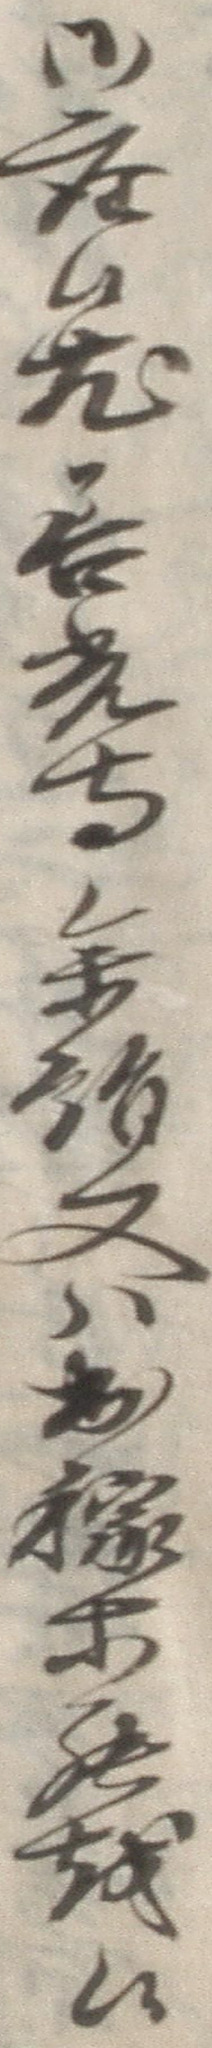御座候尤善光寺参詣又ハ出稼等罷越候
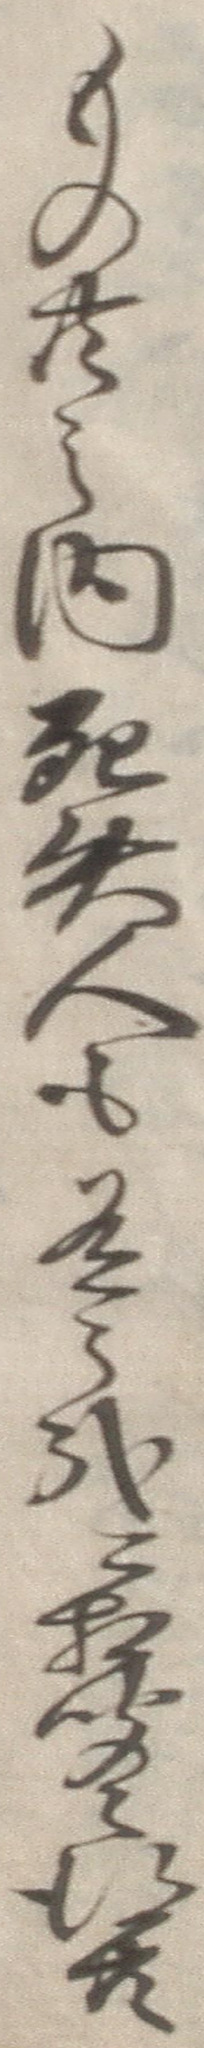もの共之内死失人有之哉二相聞候得共
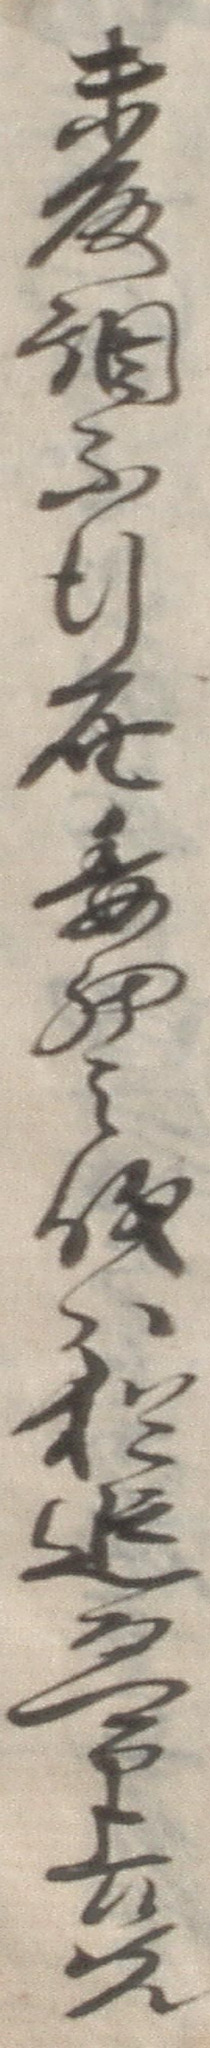未取調不行届委細之儀ハ猶追而可申上候先
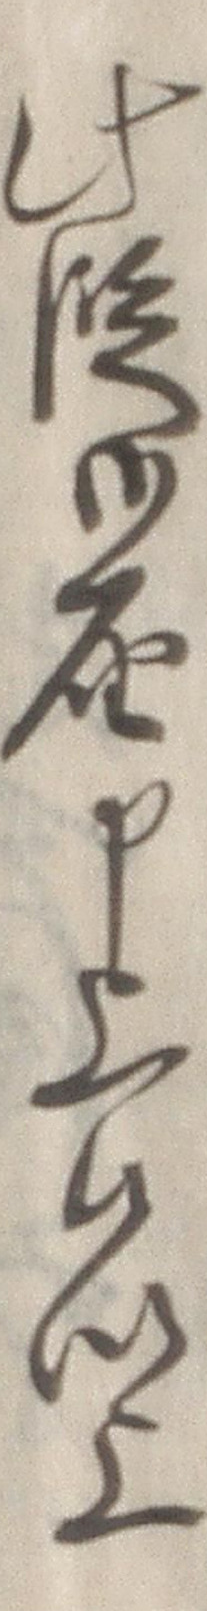此段御届申上候以上
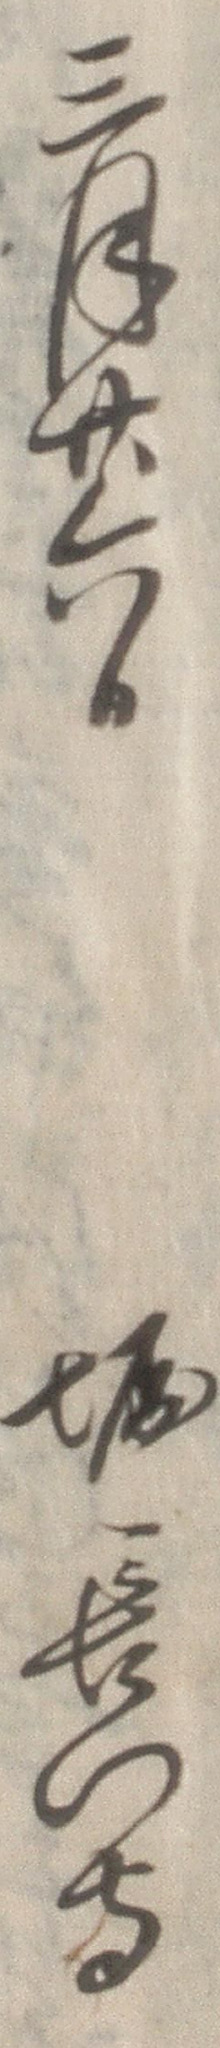三月廿六日堀長門守
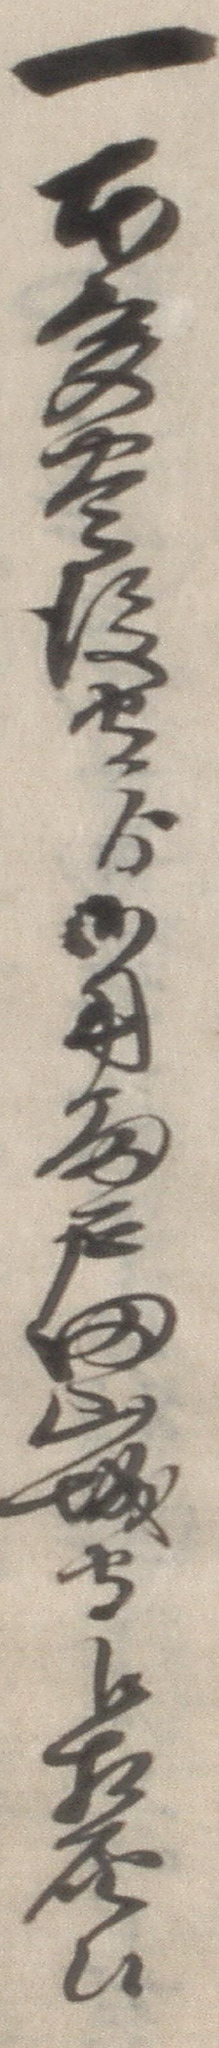一本多豊後守ゟ御用番戸田山城守江相届候
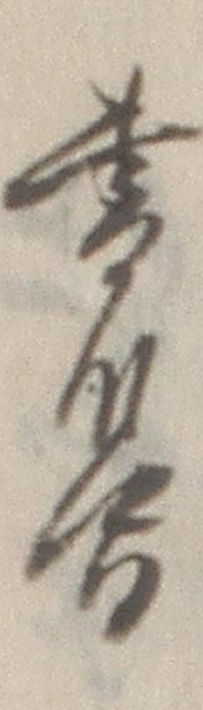書付写
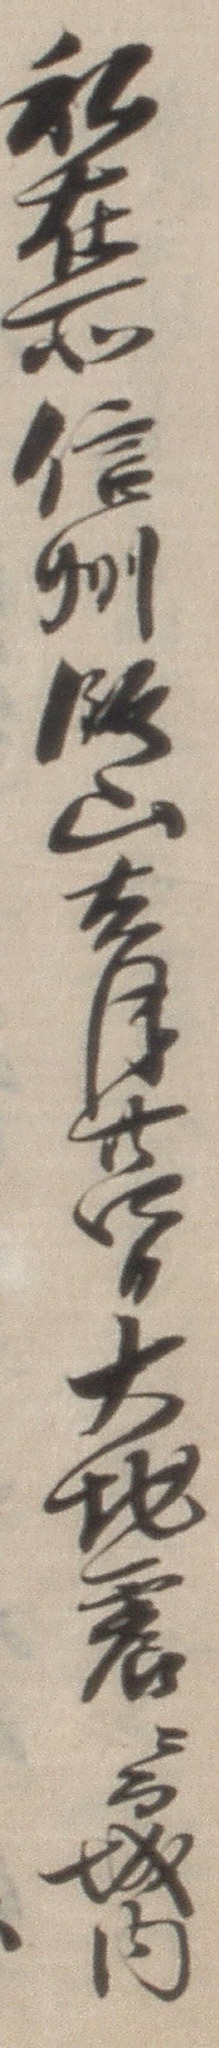私在所信州飯山去月廿四日大地震二而城内
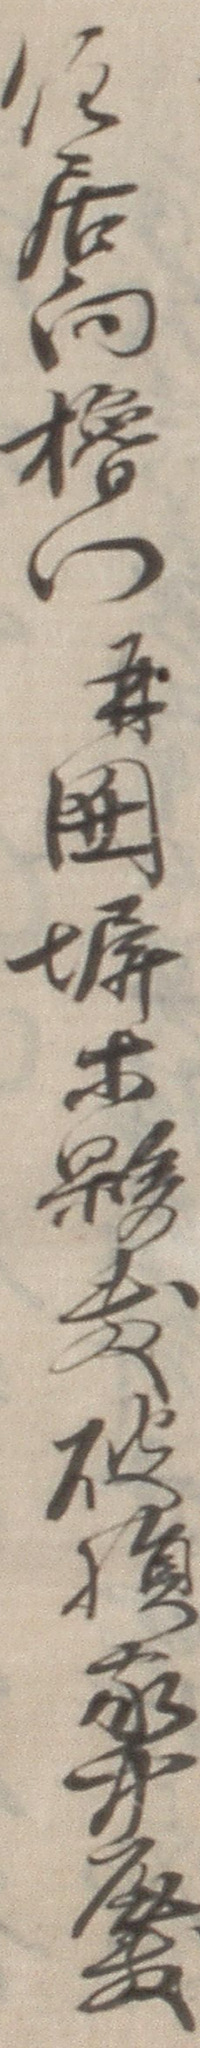住居向櫓門并囲塀等夥敷破損家中屋敷
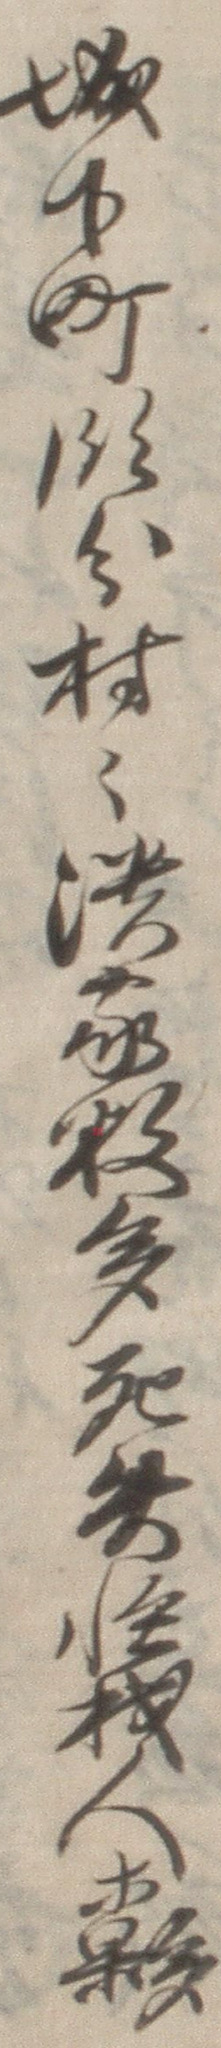城下町領分村々潰家数多死失怪我人等夥
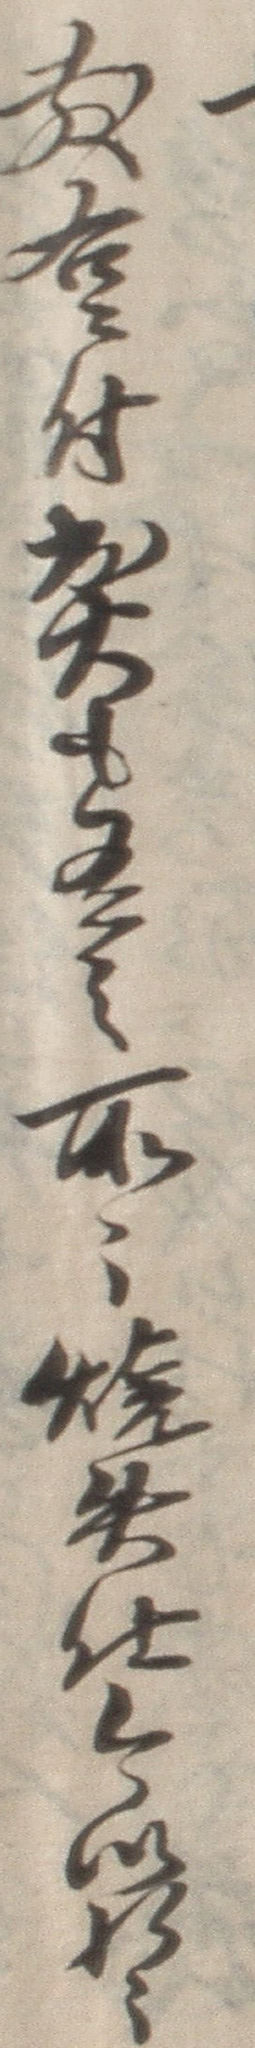敷右二付出火も有之所々焼失仕今以折々
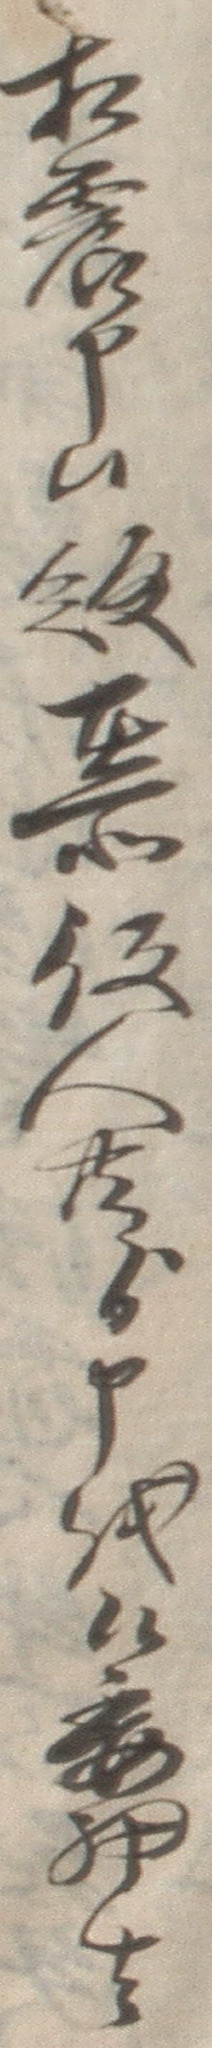相震申候趣在所役人共ゟ申越候委細は
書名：信州地震一件
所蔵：東京大学地震研究所図書室 Earthquake Research Institute Library, The University of Tokyo, JAPAN
